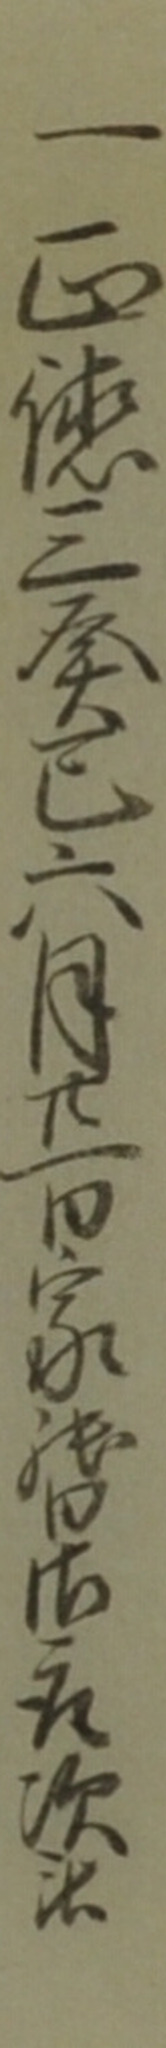一正徳三癸巳六月廿一日家督御取次被
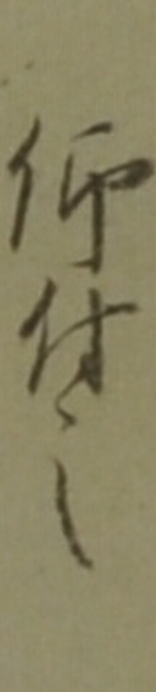仰付之
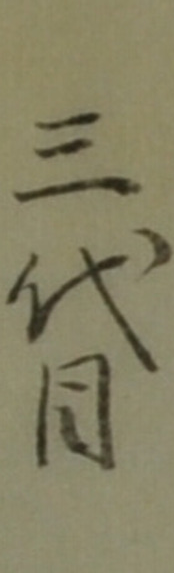三代目
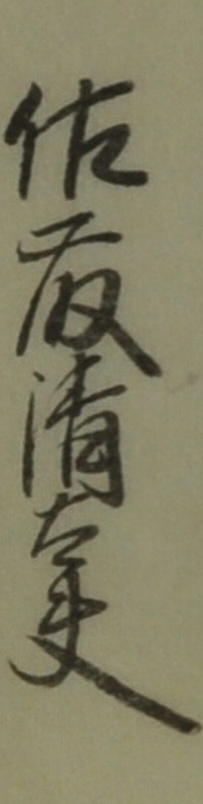佐藤清太夫
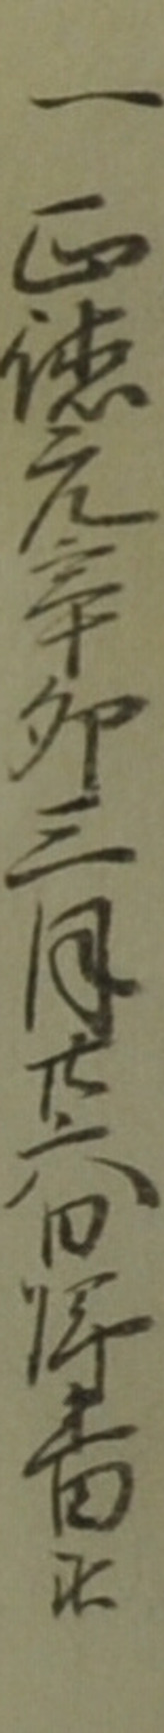一正徳元辛卯三月廿六日帰番被
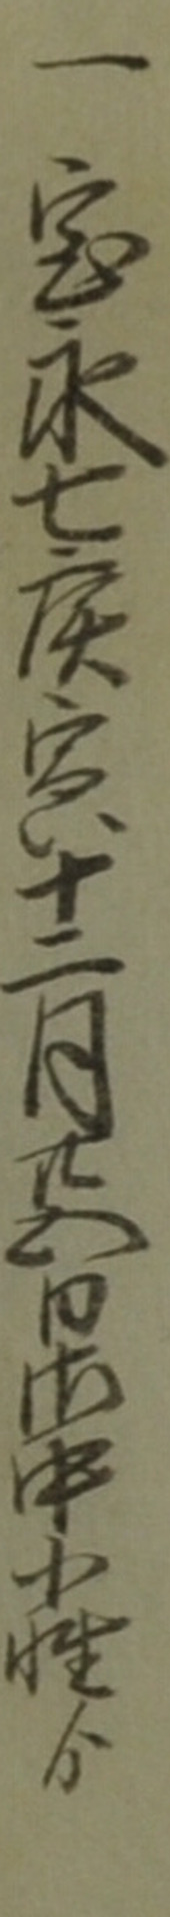一宝永七庚寅十二月廿五日御中小性ゟ
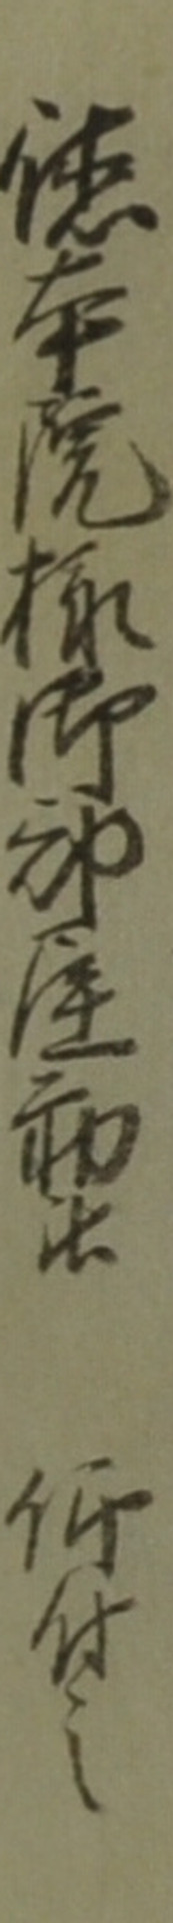徳本院様御部屋勤被仰付之
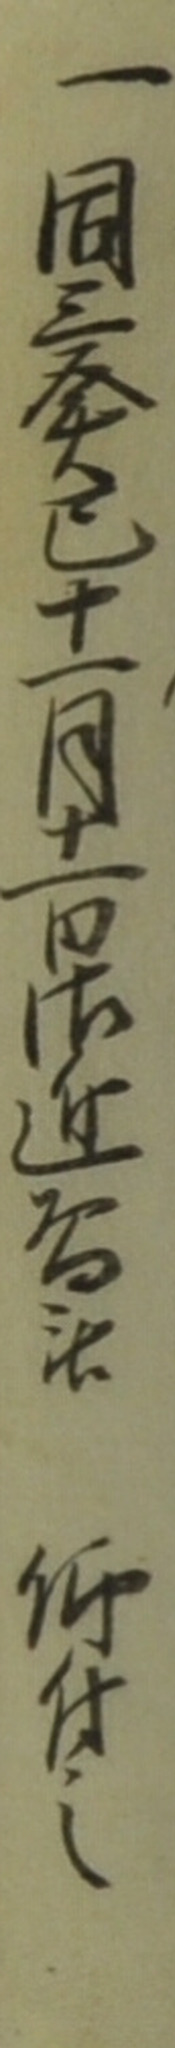一同三癸巳十一月十一日御近習被仰付之
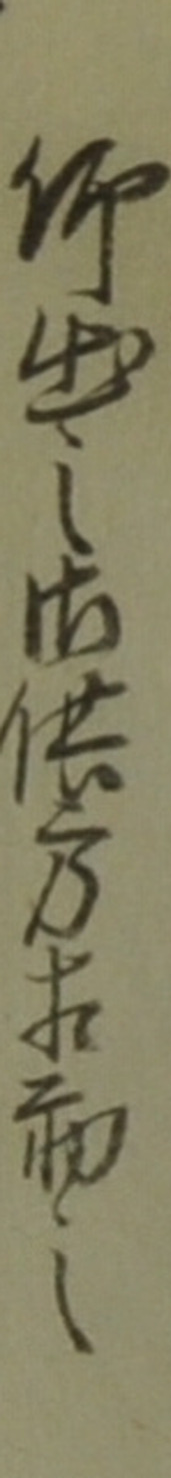仰出之御供方相勤之

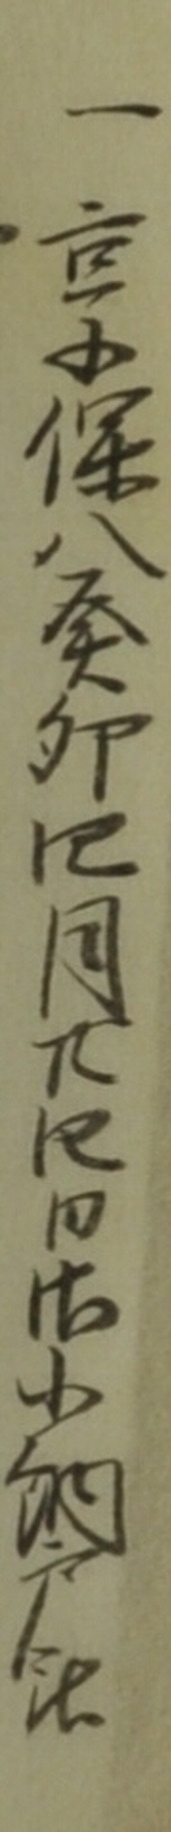一享保八癸卯四月廿四日御小納戸被
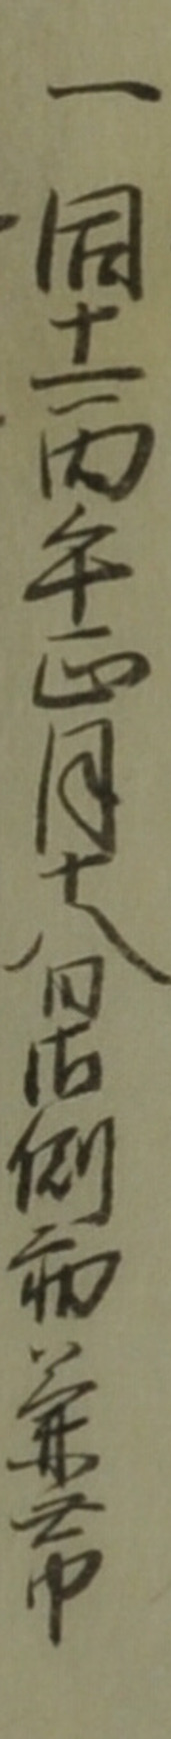一同十一丙午正月十八日御側勤兼帯
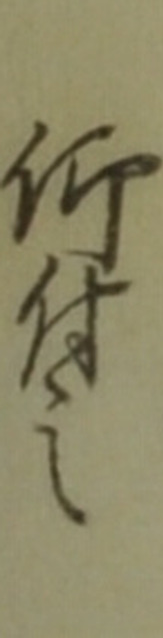仰付之
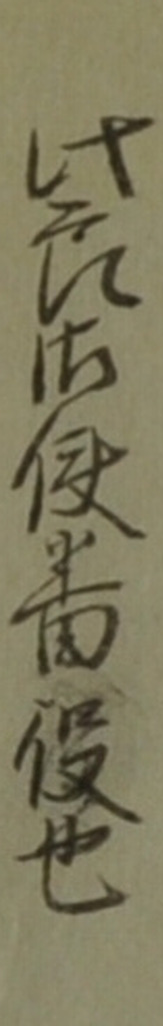此節御使番役也
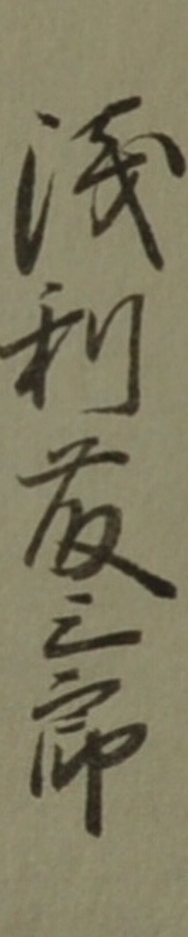浅利藤三郎
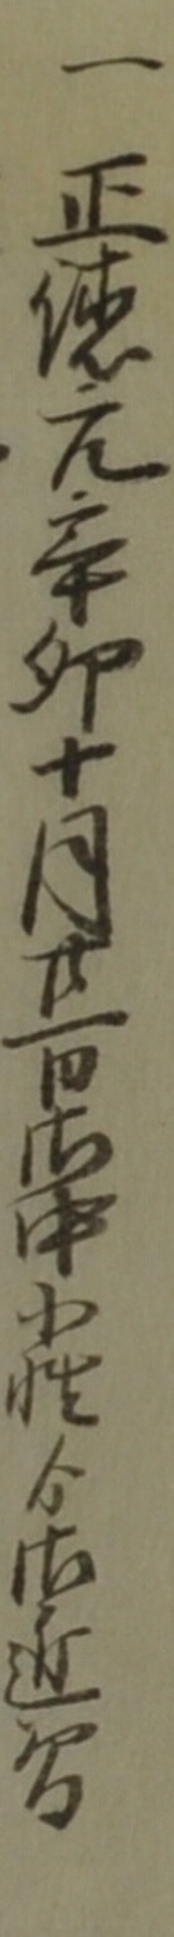一正徳元辛卯十月廿一日御中小性ゟ近習
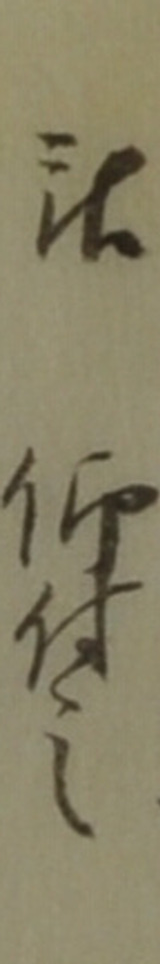被仰付之
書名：諸御役代々録（五）
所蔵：伊那市立高遠町図書館・合同会社AMANE
